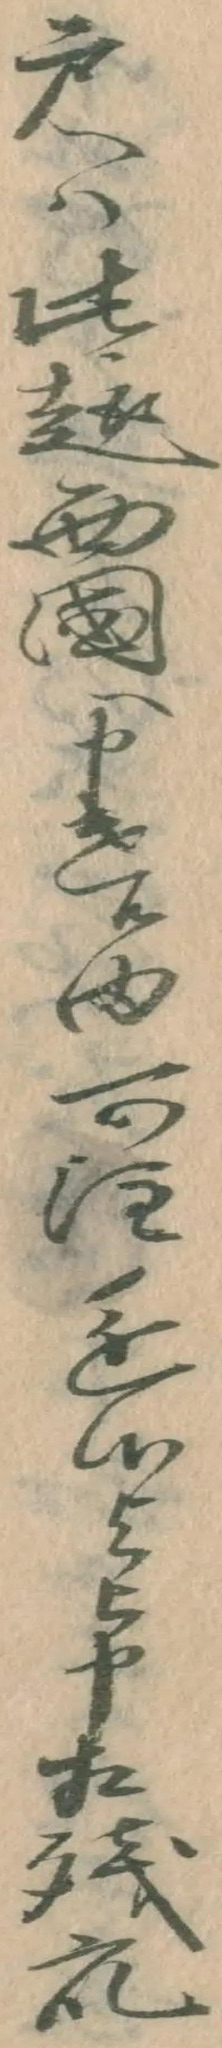戸へは此趣西国へ申遣候由可注進候与被申相残衆

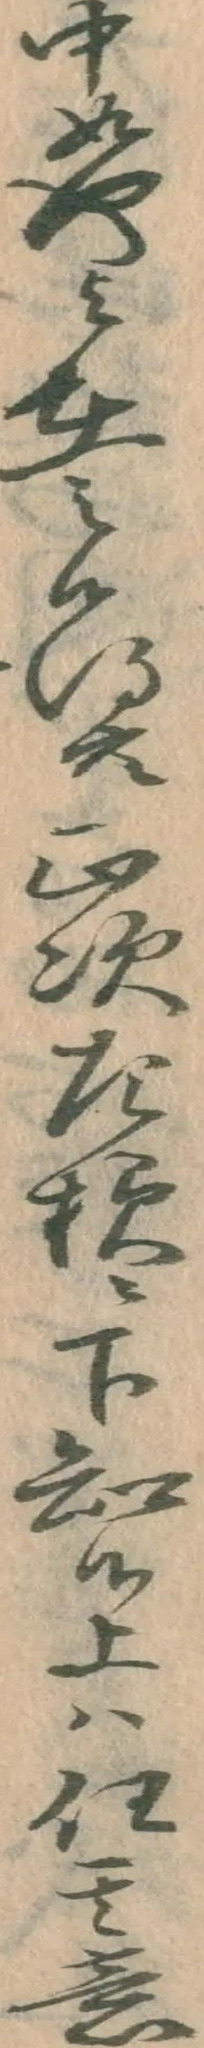中如何与在之候得共正次左様に下知候上は任其意
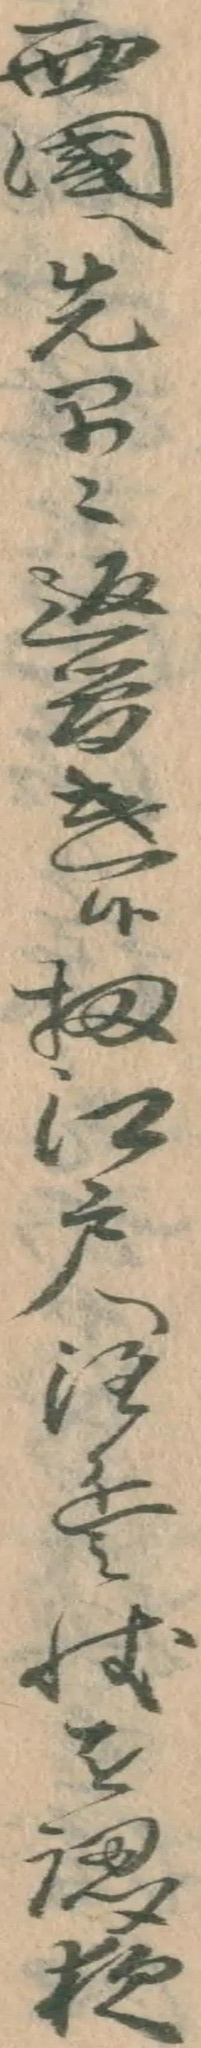西国へ先早々返簡遣候扨江戸へ注進之状を認め夜
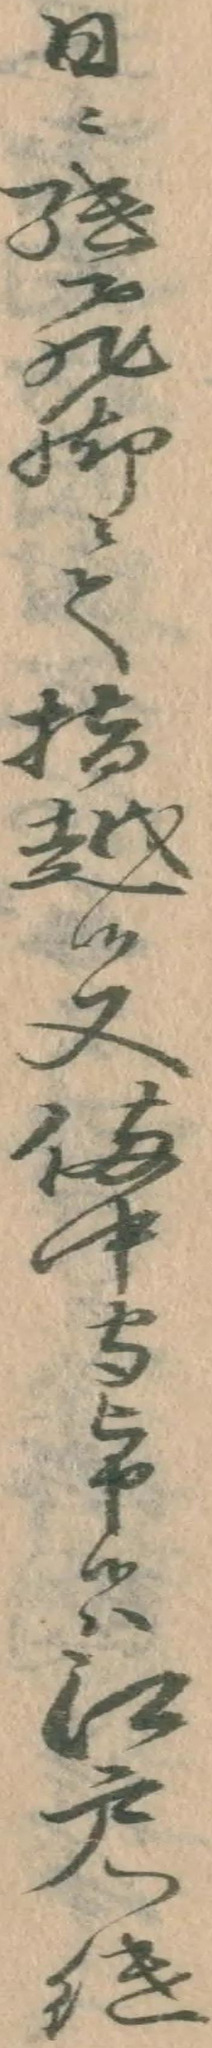日に鑓飛脚にて指越候又備中守被申候は江戸へ鑓
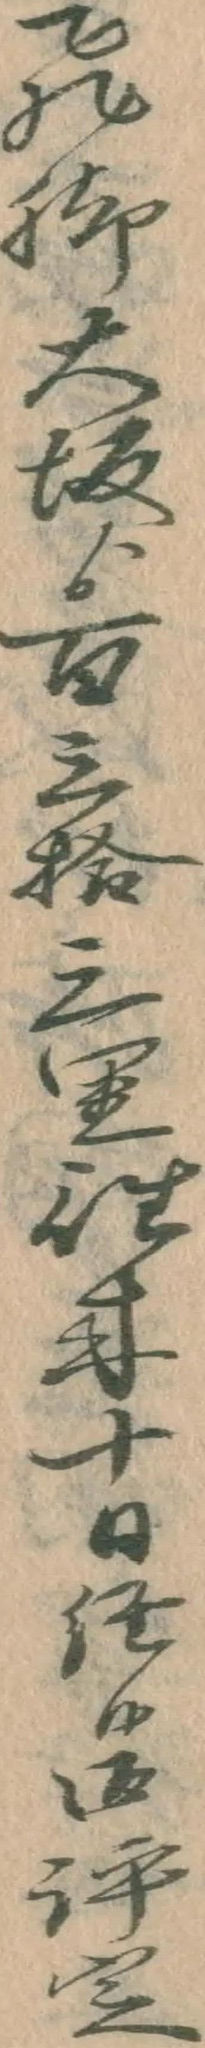飛脚大坂ゟ百三拾三里往来十日経候御評定
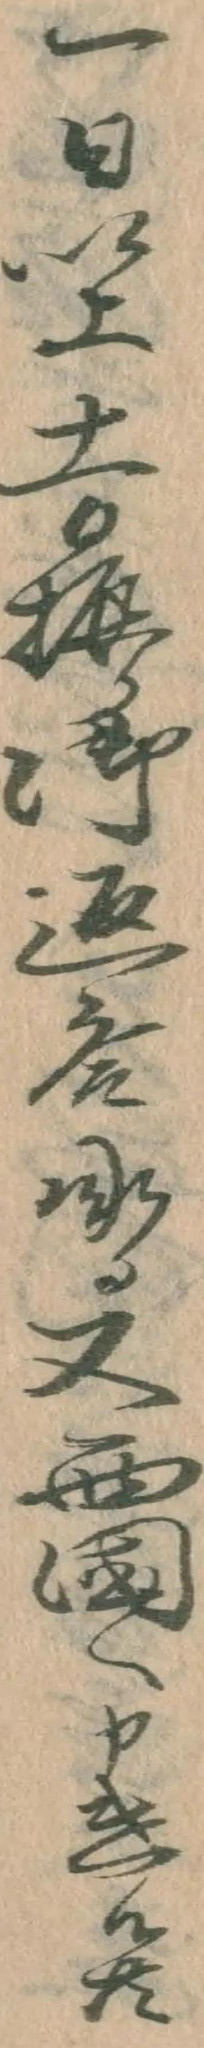一日以上十一日振り御返答承る又西国へ申遣候共
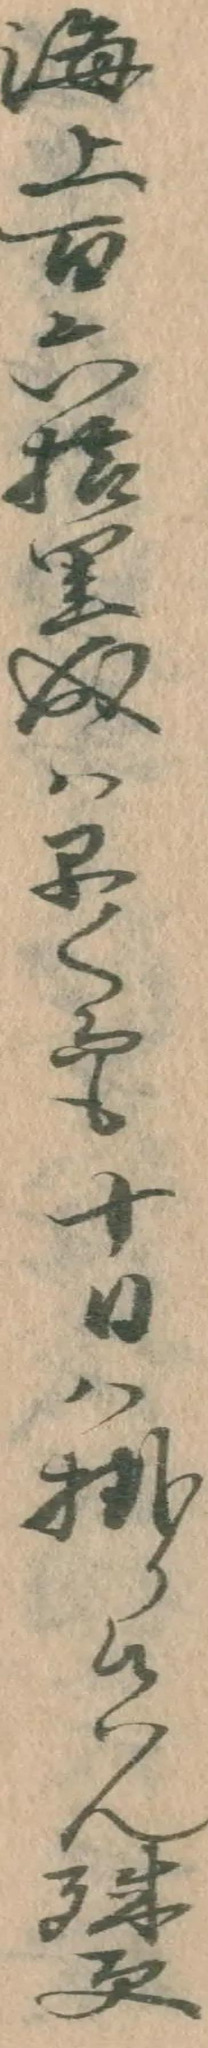海上百六拾里成は早く而も十日は掛り候はん殊更
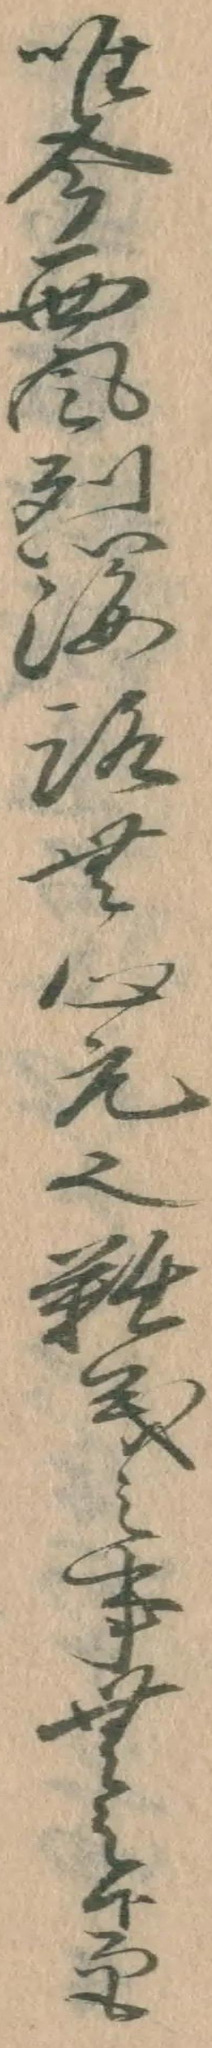唯今西風烈海路無心元也難義之事無之候而も
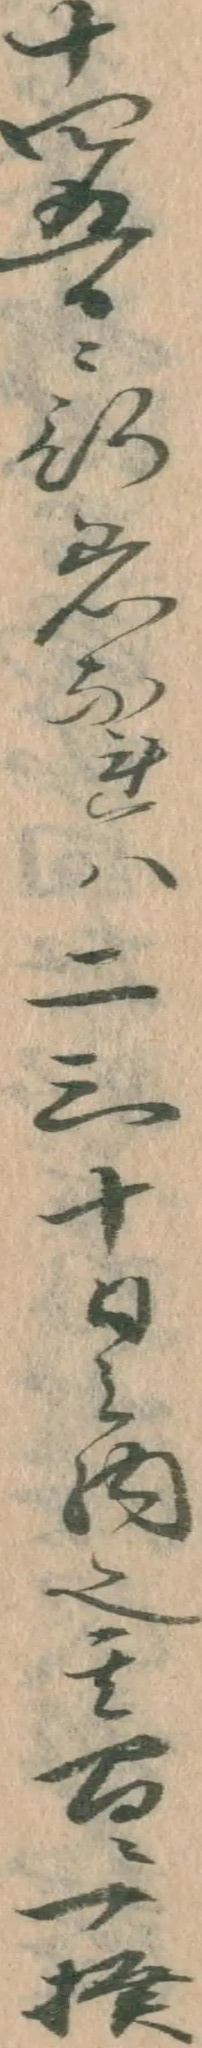十四五日に行着な連は二三十日之内也其間に一揆
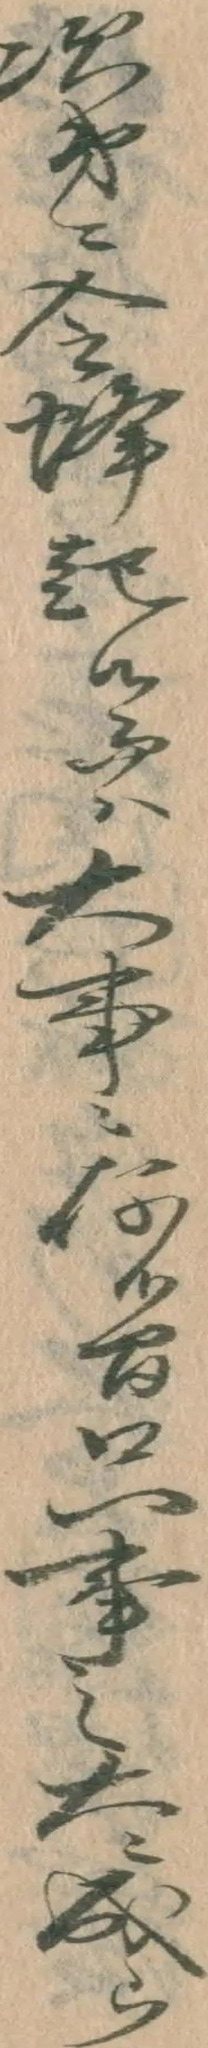次第に令蜂起候而は大事に存候間只事之大に成ら
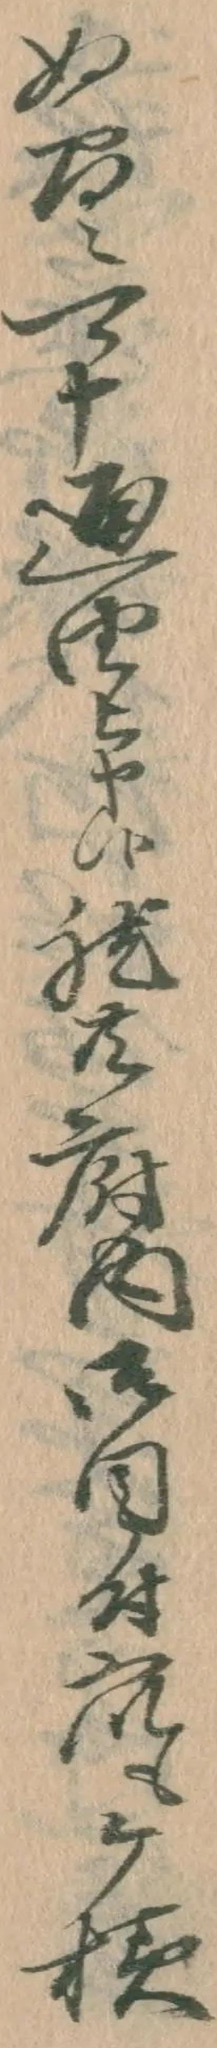ぬ間に可申通由被申候然共府内御目付衆もけ様
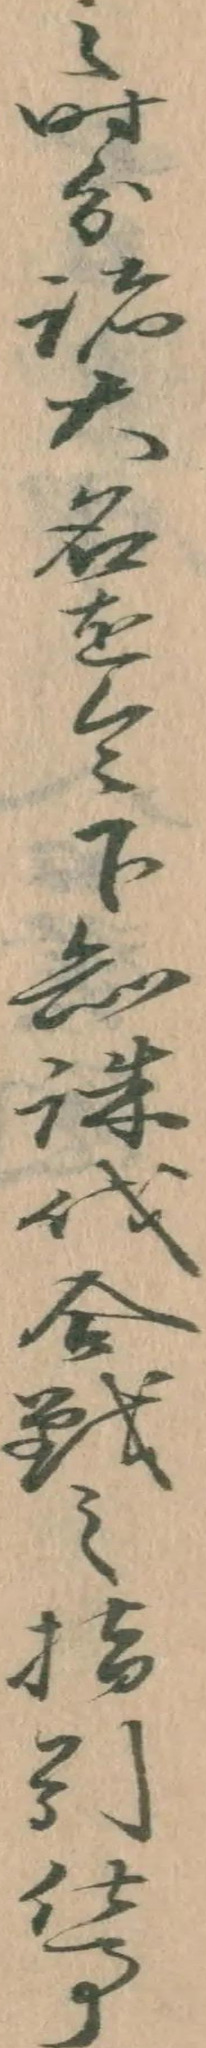之時分諸大名を令下知誅伐合戦之指引仕事
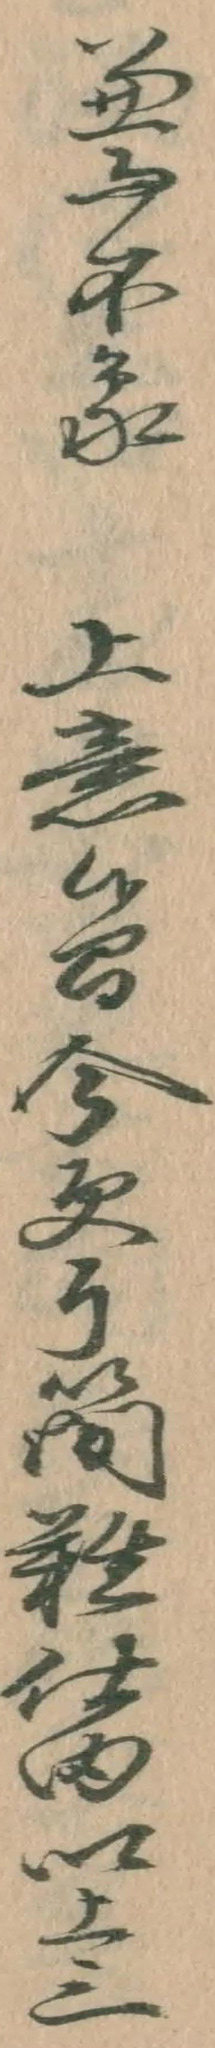兼而不承上意候間今更了簡難仕由以上三
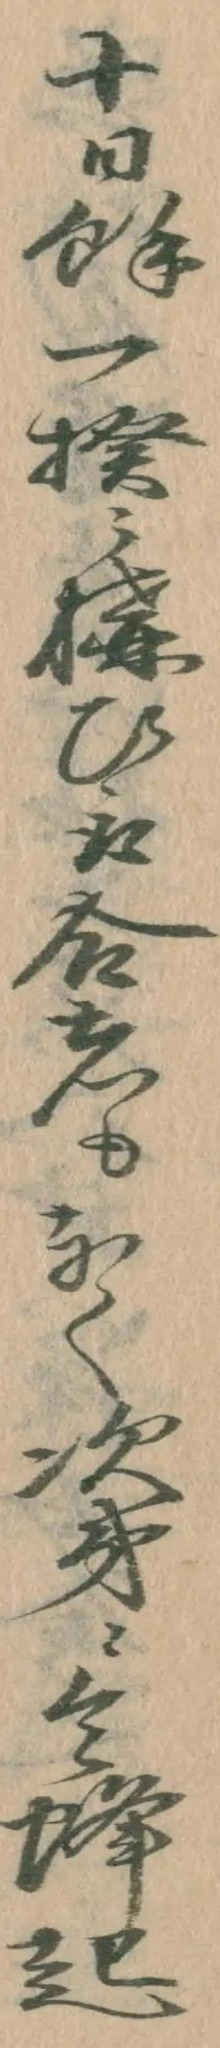十日余一揆之構ひ取合者もなく次第に令蜂起
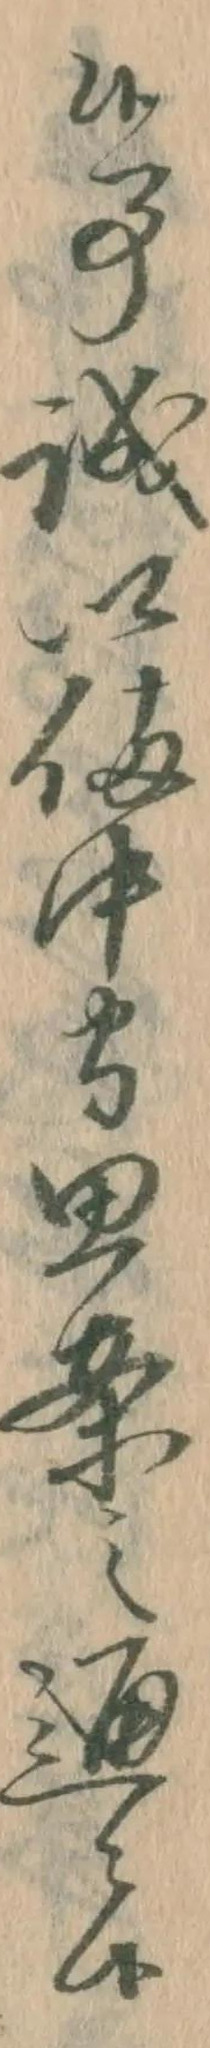候事誠以備中守思案之通に候
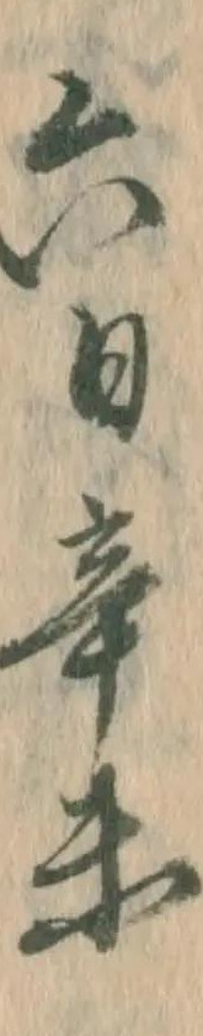六日辛未
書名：切支丹御退治記 49巻. [2]
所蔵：国立国会図書館 National Diet Library, JAPAN
